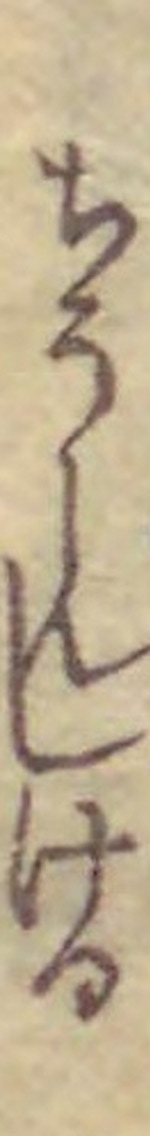ちうしんしける

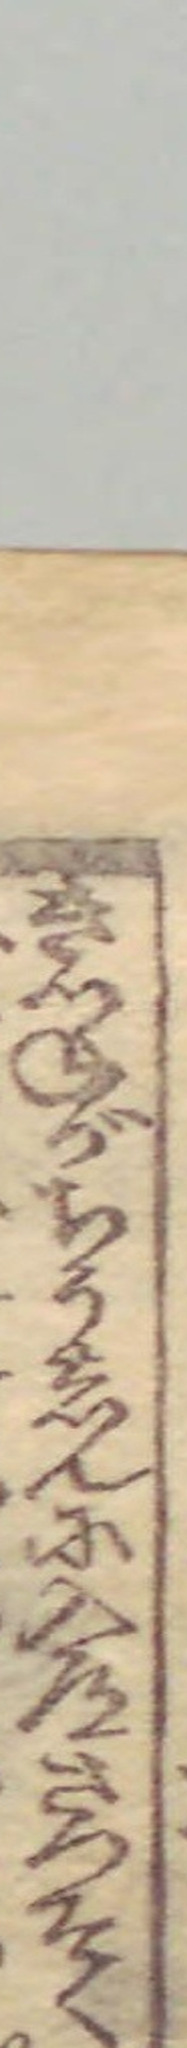きつねがちうしんに入道さつそく
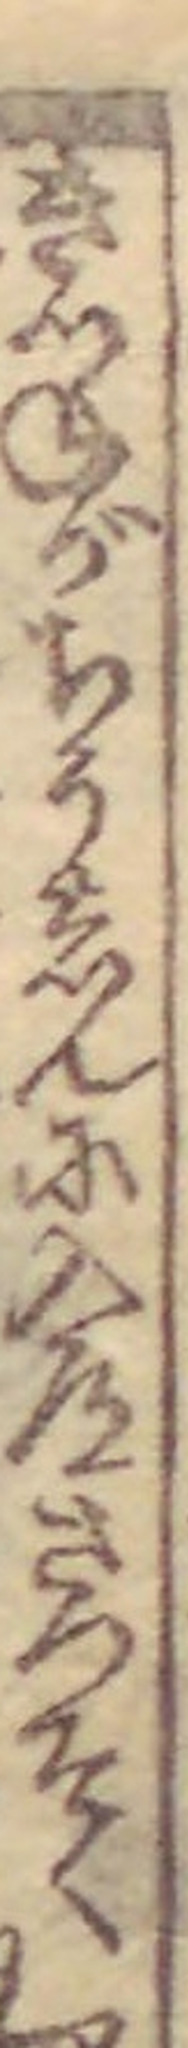きつねがちうしんに入道さつそく
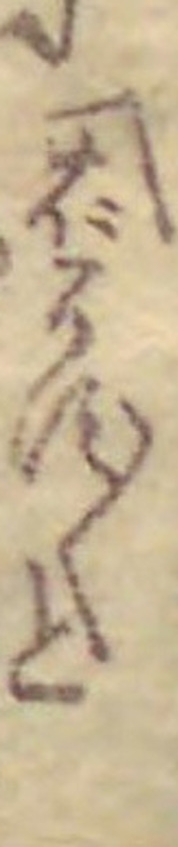〽ばかす〳〵と
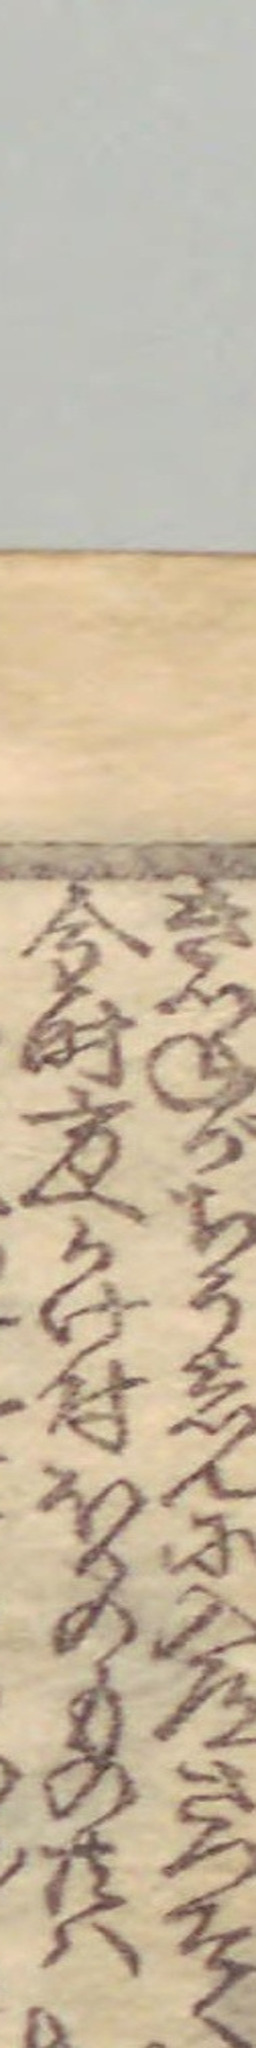金時方へかけ付ほかのもの共は
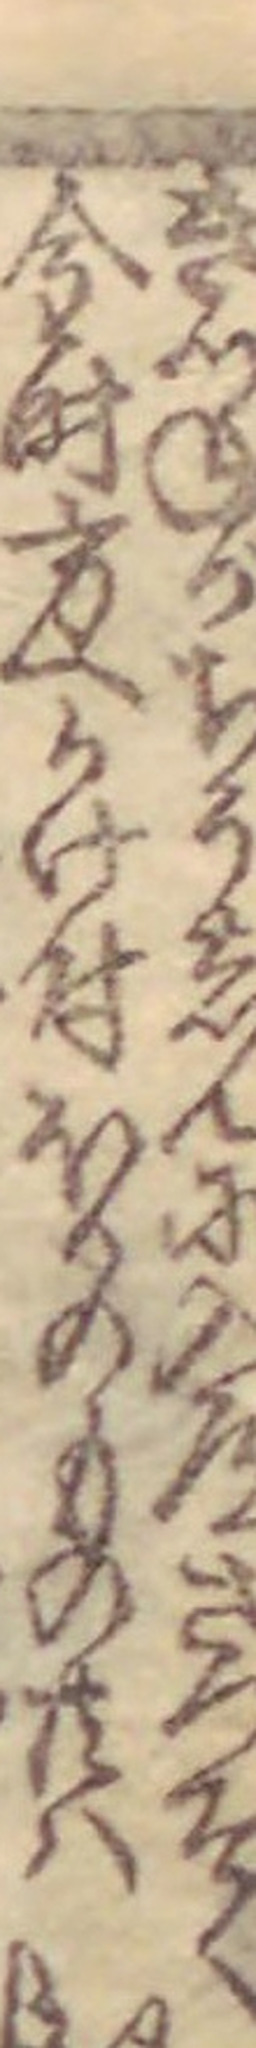金時方へかけ付ほかのもの共は
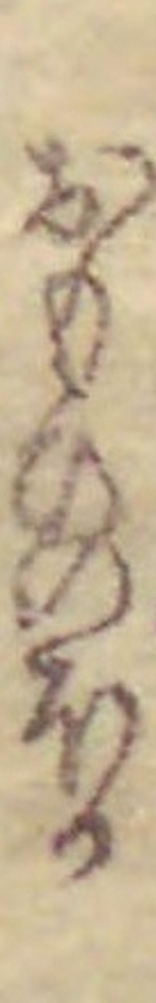おもひのほか
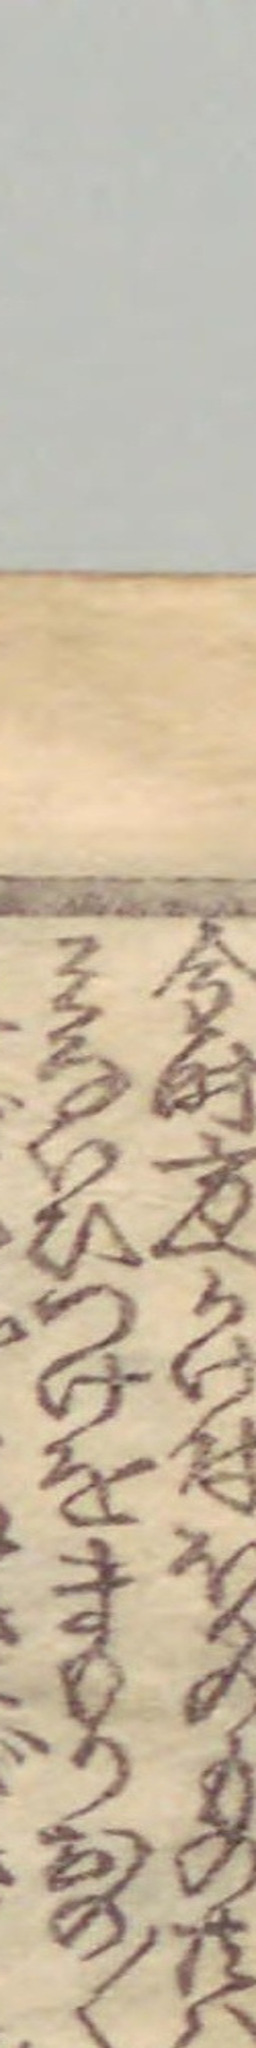みないひつけをまもりおの〳〵
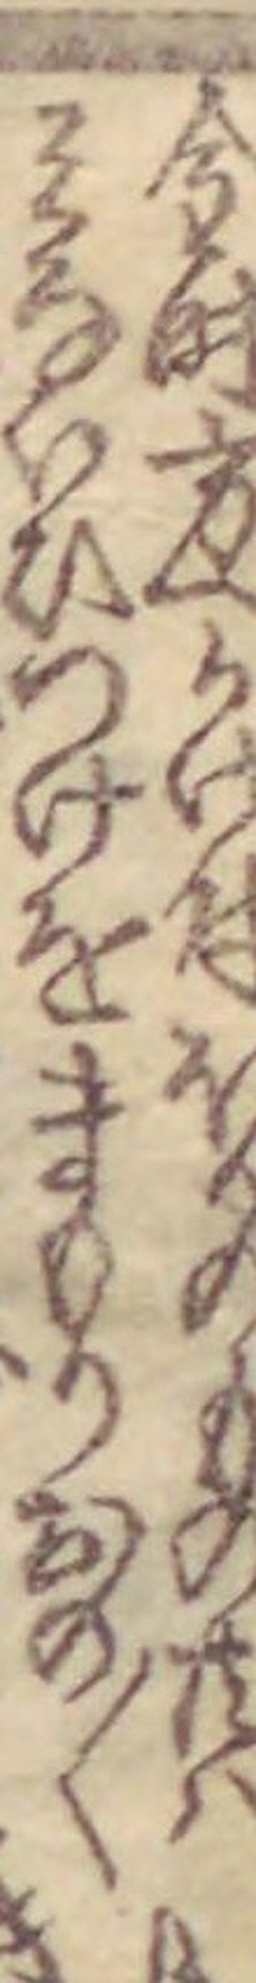みないひつけをまもりおの〳〵
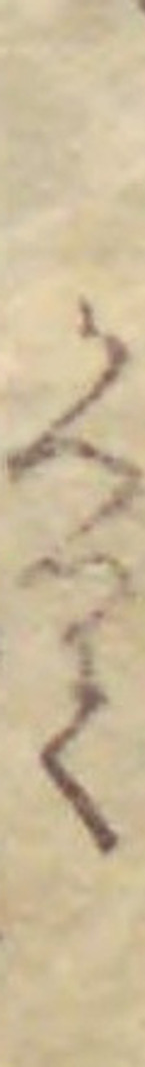かへつて
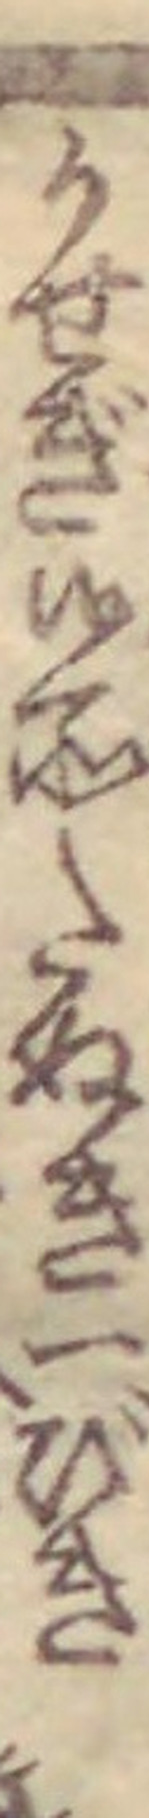かせぎ候所たぬき一びき
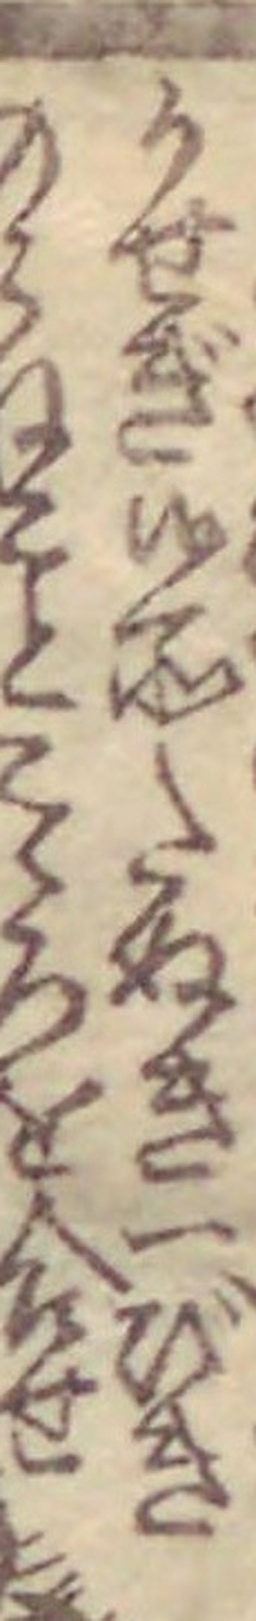のらねことこゝろを合せ
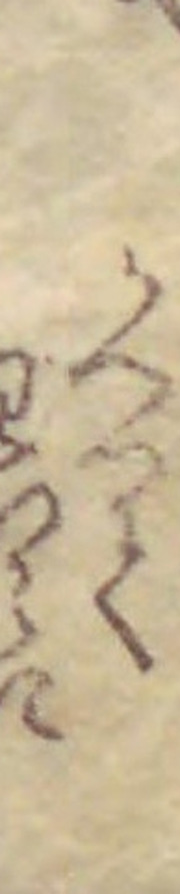わいらに
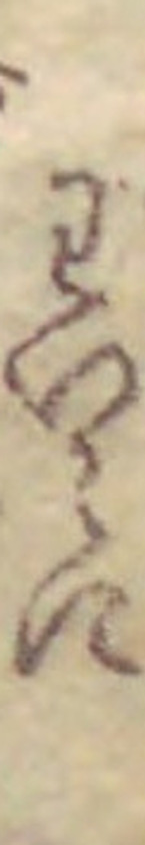わいらに
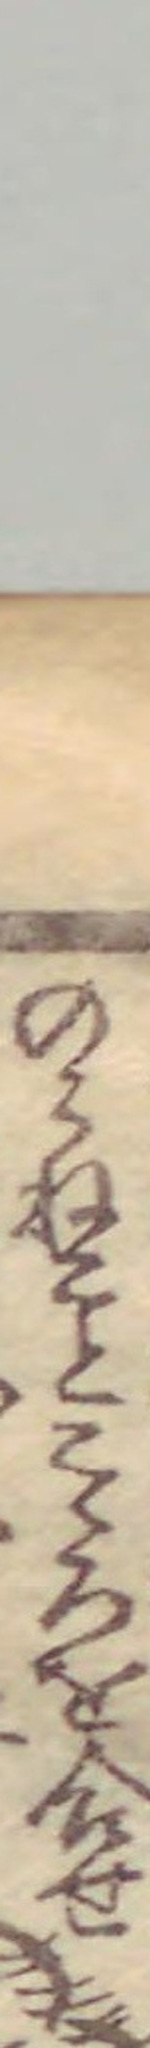のらねことこゝろを合せ
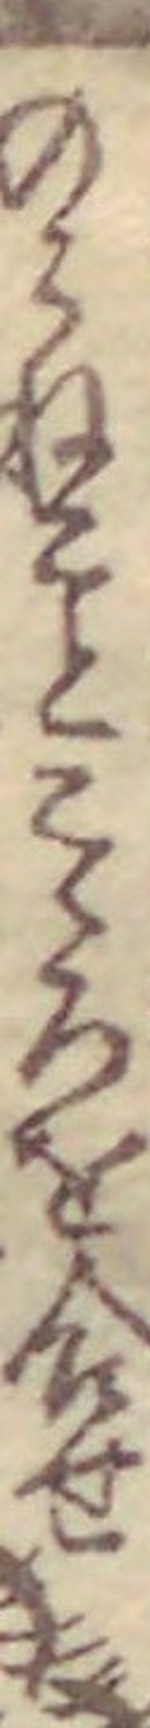のらねことこゝろを合せ
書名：化物世帯氣質
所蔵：国立国会図書館 National Diet Library, JAPAN
